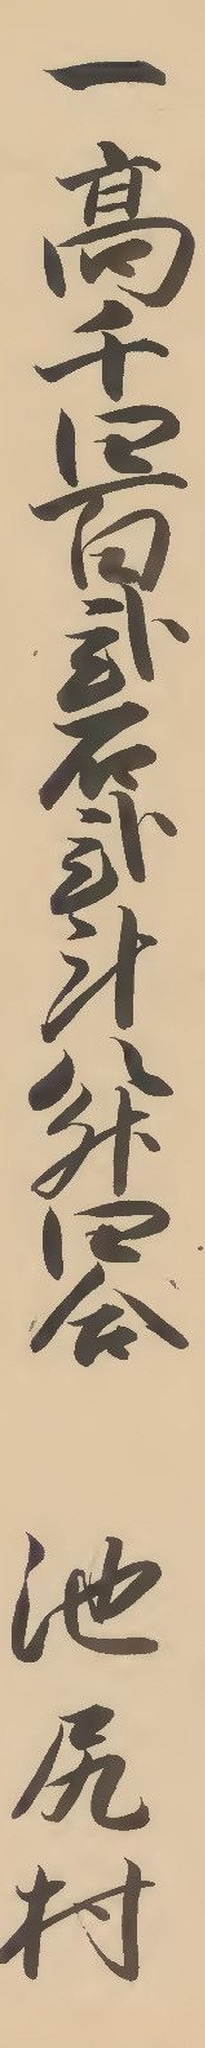一高千四百弐石弐斗八升四合池尻村

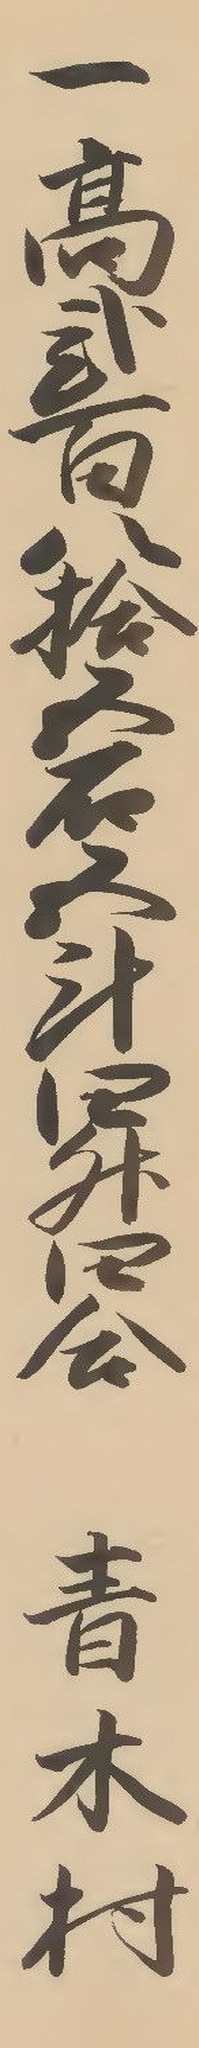一高弐百八拾五石五斗四升四合青木村
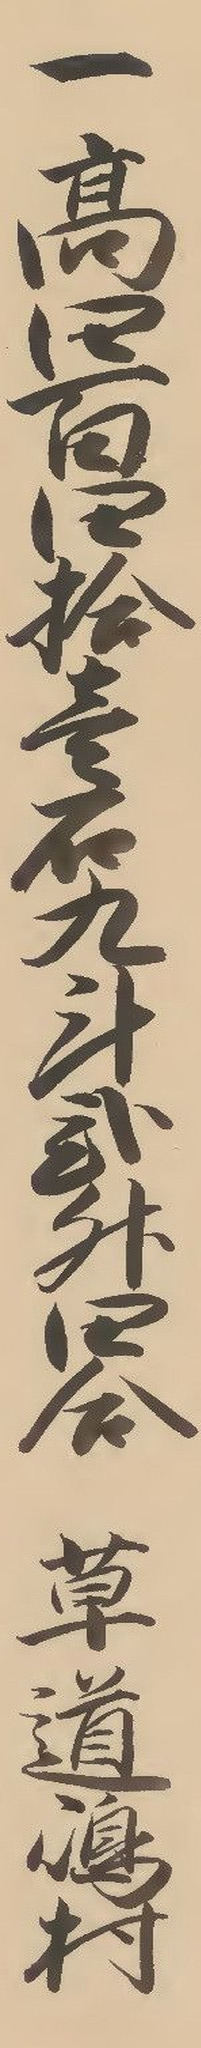一高四百四拾壱石九斗弐升四合草道島村
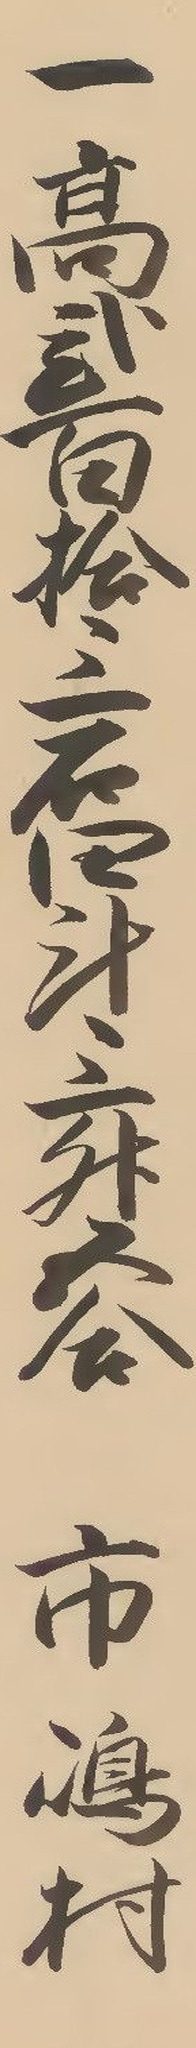一高弐百拾三石四斗三升五合市島村
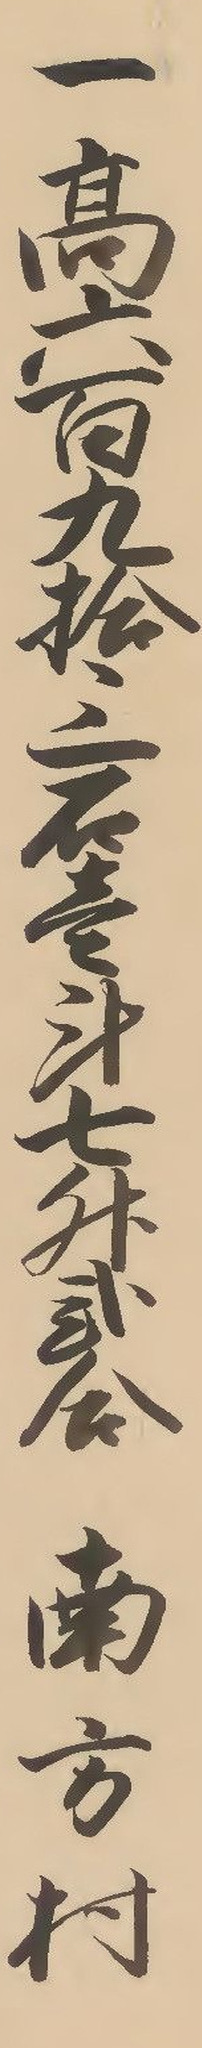一高六百九拾三石壱斗七升弐合南方村
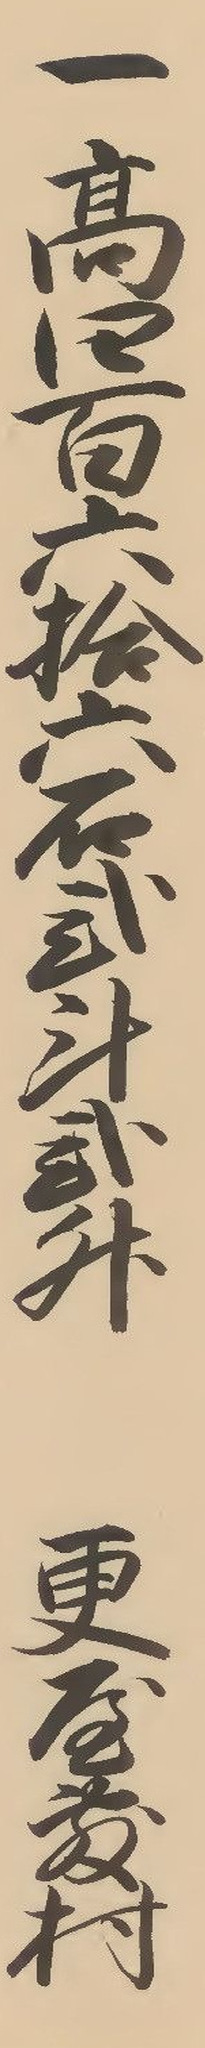一高四百六拾六石弐斗弐升更屋敷村
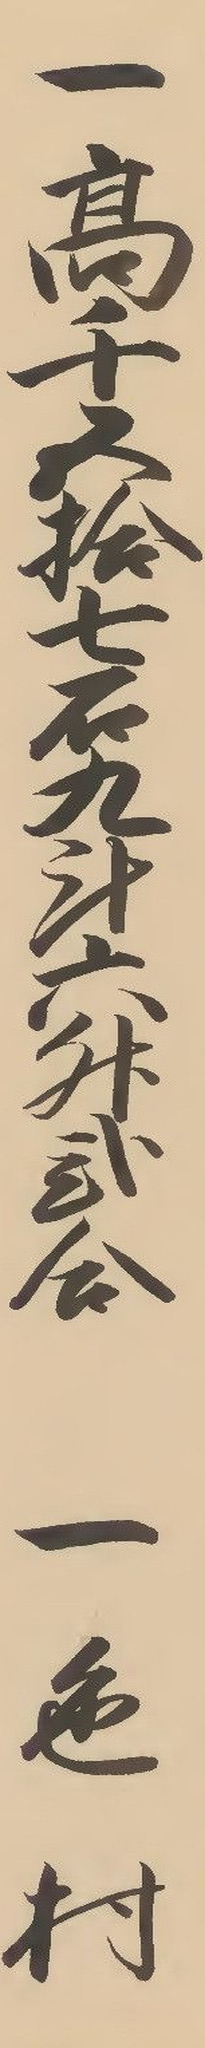一高千五拾七石九斗六升弐合一色村
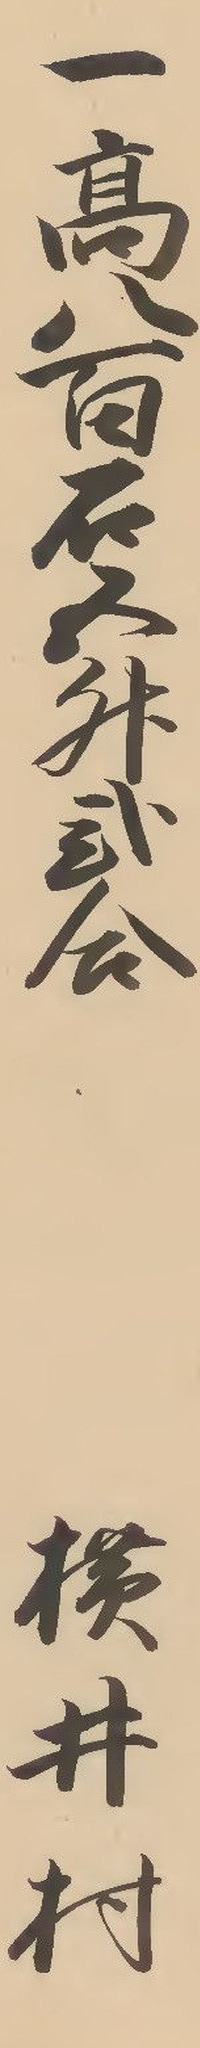一高八百石五升弐合横井村

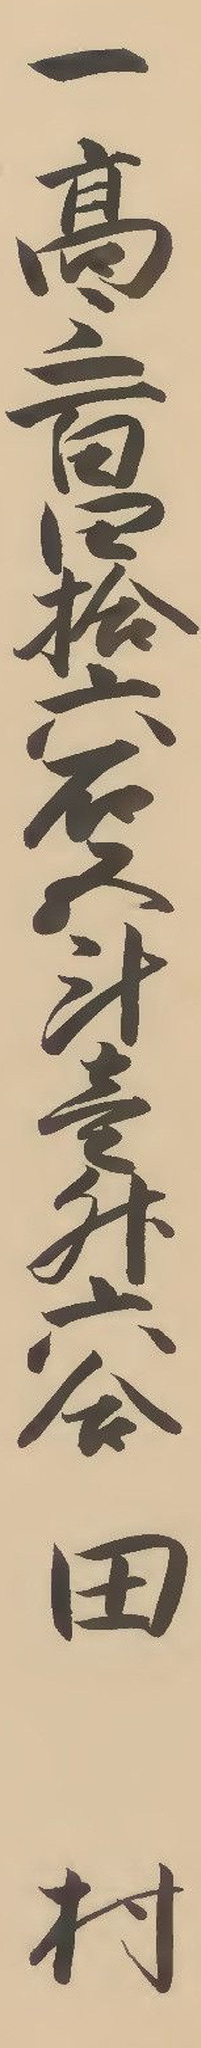一高三百四拾六石五斗壱升六合田村
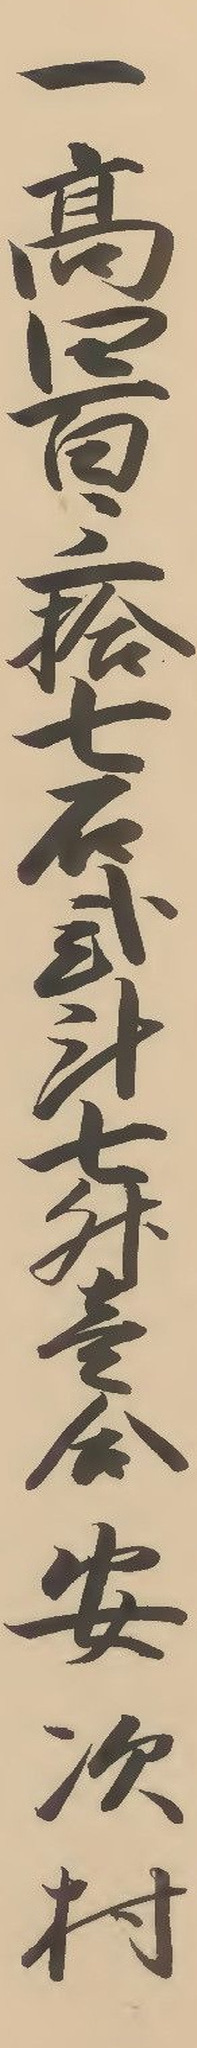一高四百三拾七石弐斗七升壱合安次村
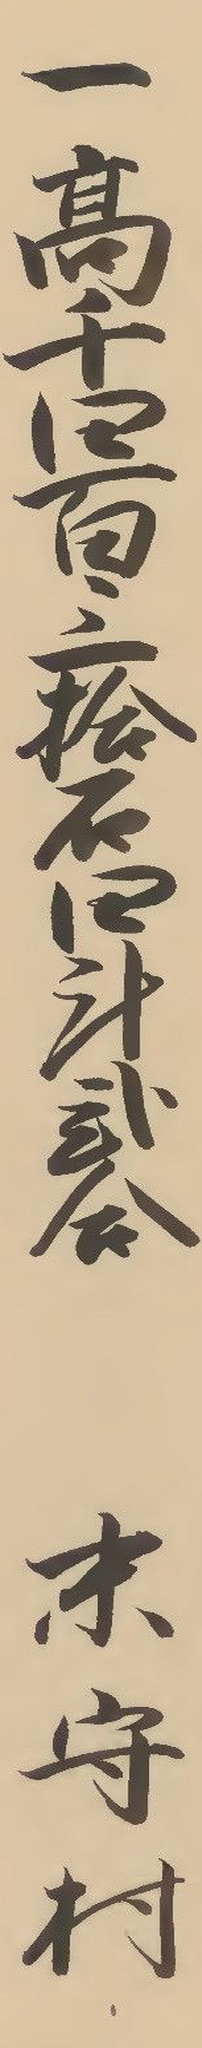一高千四百三拾石四斗弐合末守村
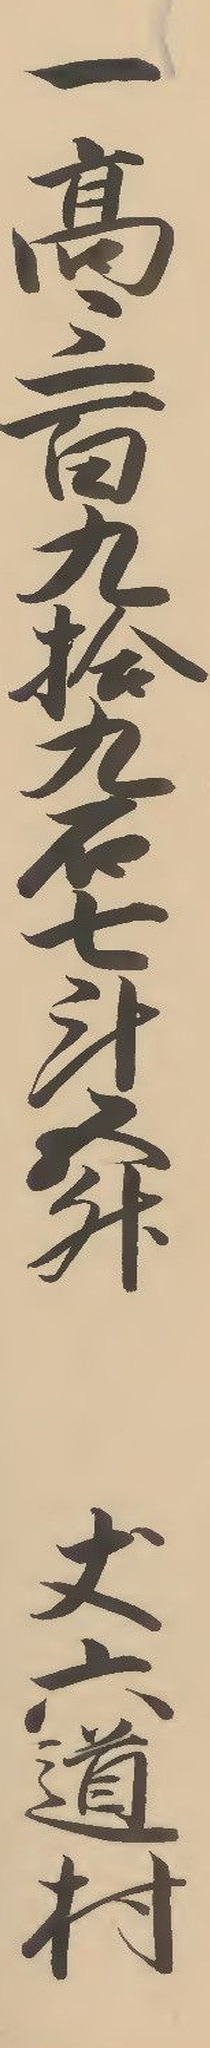一高三百九拾九石七斗五升丈六道村
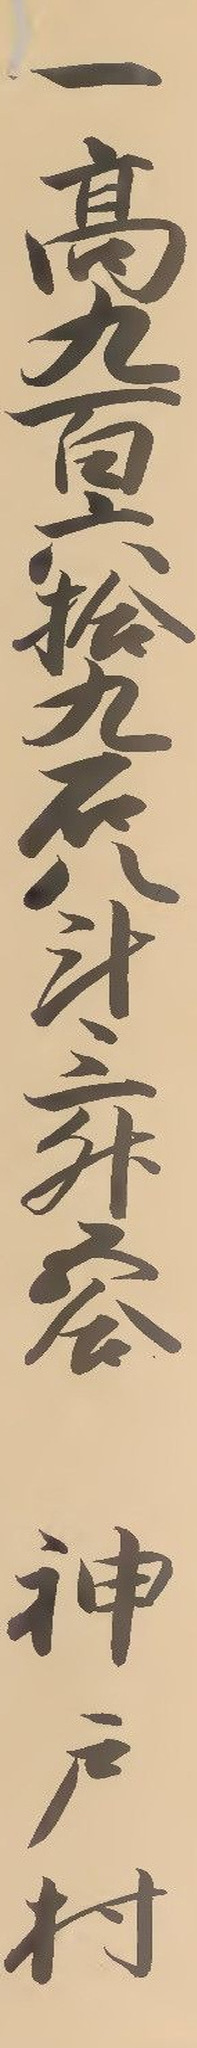一高九百六拾九石八斗三升五合神戸村
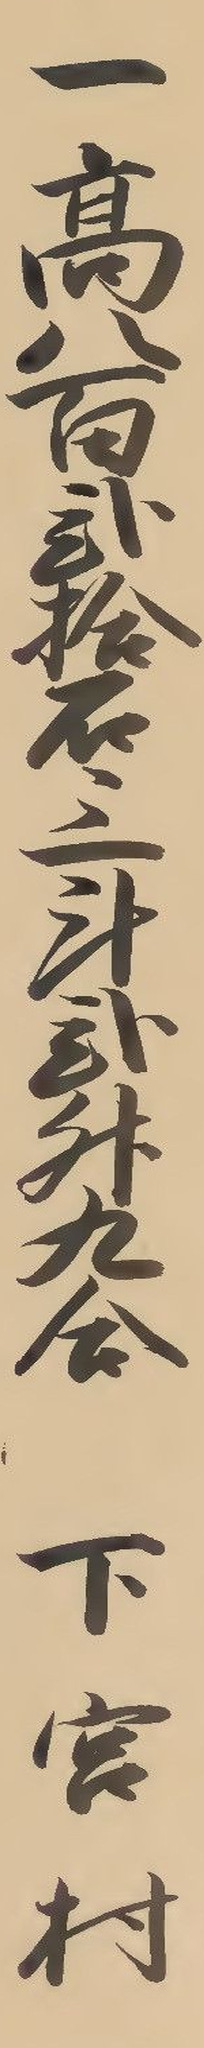一高八百弐拾石三斗弐升九合下宮村
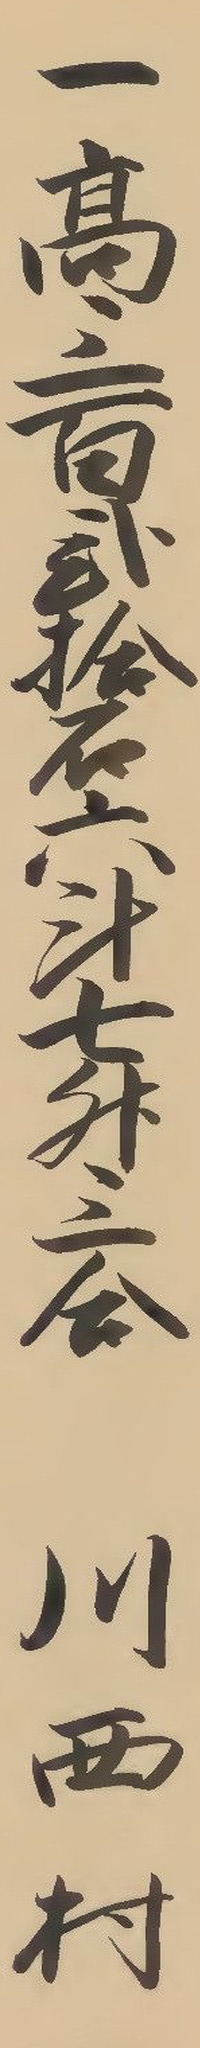一高三百弐拾石六斗七升三合川西村
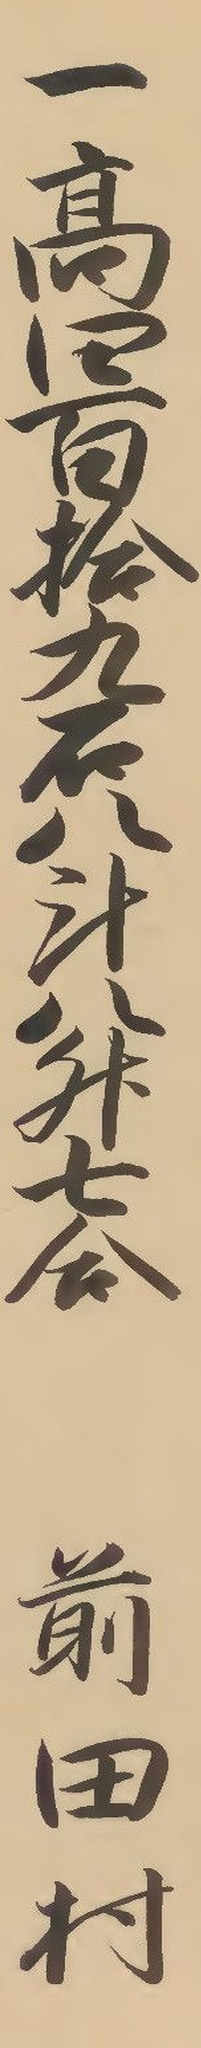一高四百拾九石八斗八升七合前田村
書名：美濃国郷帳
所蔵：国立公文書館 National Archives of Japan
